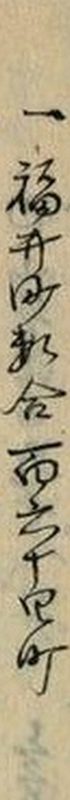一福井町数合百六十四町
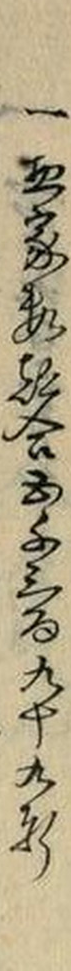一惣家数都合五千三百九十九軒
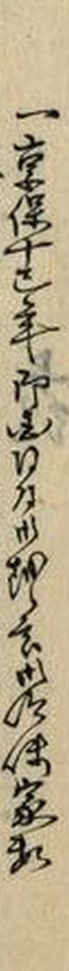一享保十巳年御国目付御越之節御吟味家数
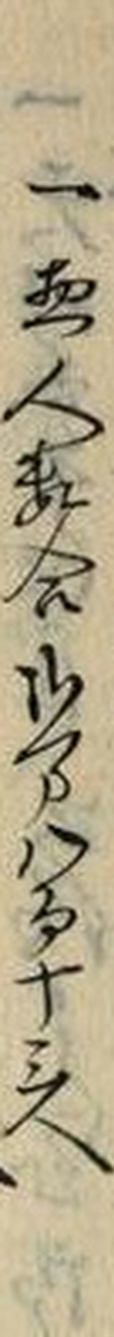一惣人数合弐万八百十三人
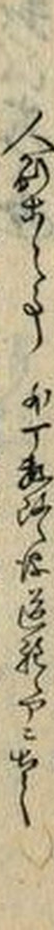人別当等之事外丁数改之儀道程之部ニ出之
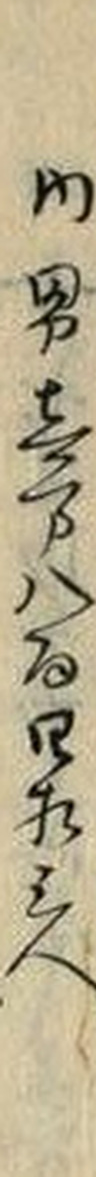内男壱万八百四拾三人
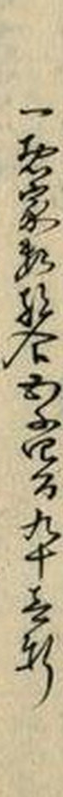一惣家数都合五千四百九十壱軒
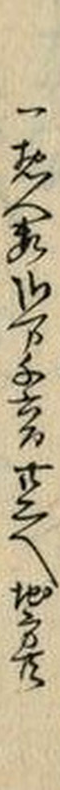一惣人数合弐万千六百廿二人
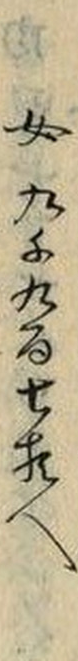女九千九百七拾人
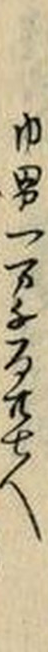内男一万千百廿七人
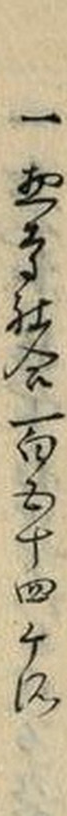一惣寺社合百五十四ケ所
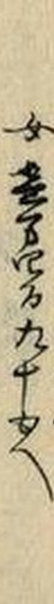女壱万四百九十五人
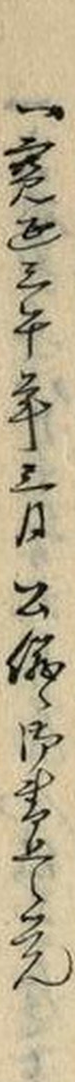一寛延三午年三月公儀へ御書上候覚
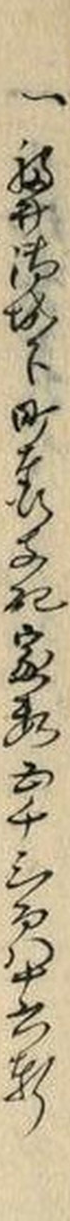一福井御城下町奉行支配家数五千三百八十六軒
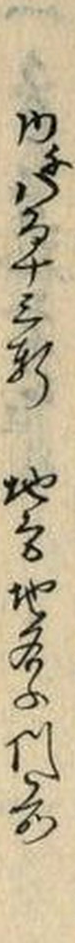内千八百十三軒地方地名子門前
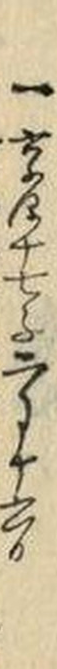一享保十七子二月十六日
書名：御国他国諸事之部
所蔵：福井県文書館 Fukui Prefectural Archives
